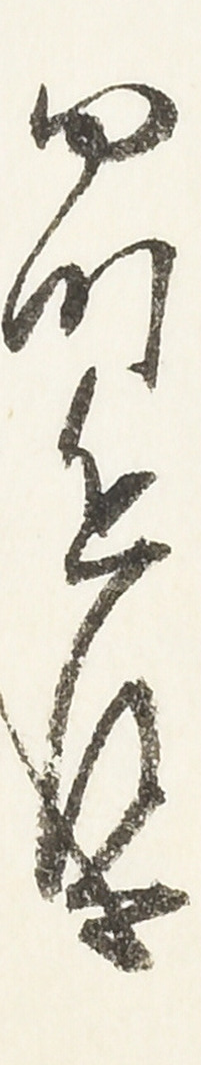中町近江や
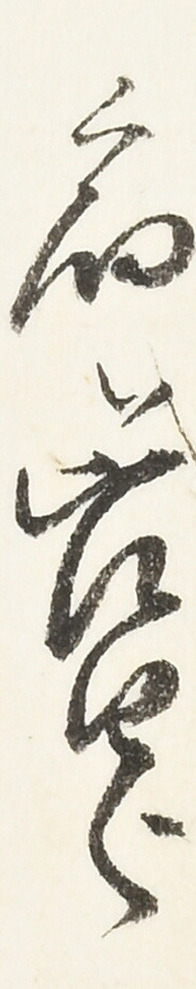宿善四郎
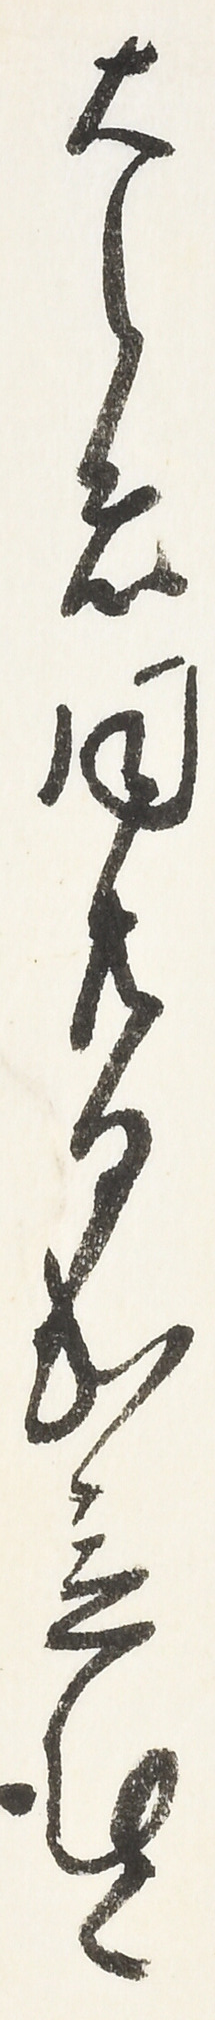右之者同廿日出立仕候
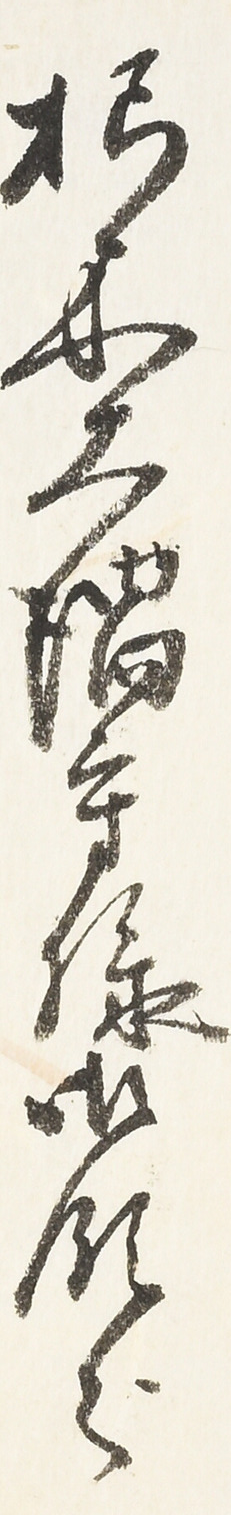朽木大隅守様御領分
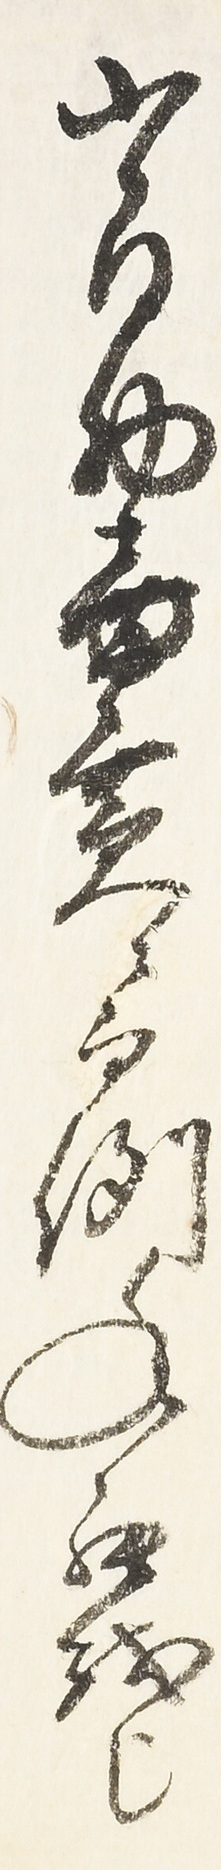小間物商売ニ而例年罷越申候
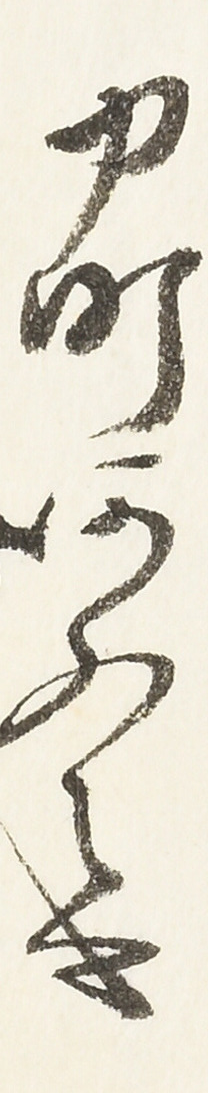中町あふみや
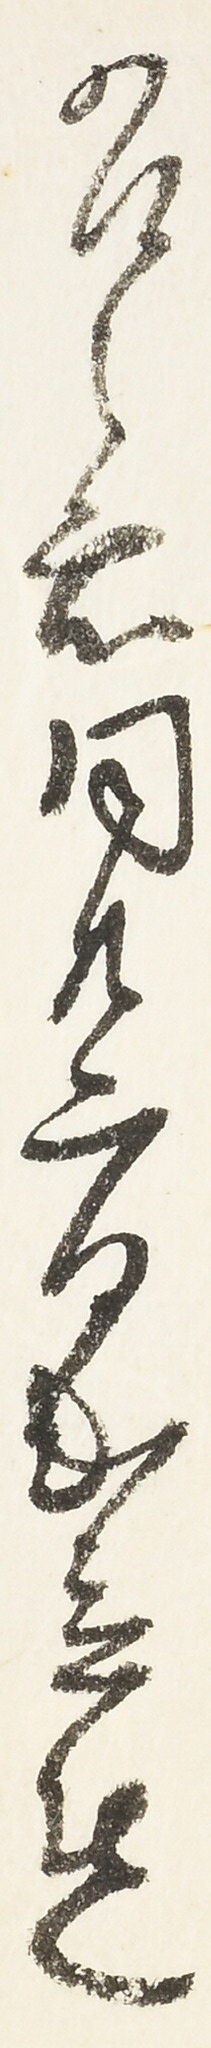右之者同廿二日出立仕候
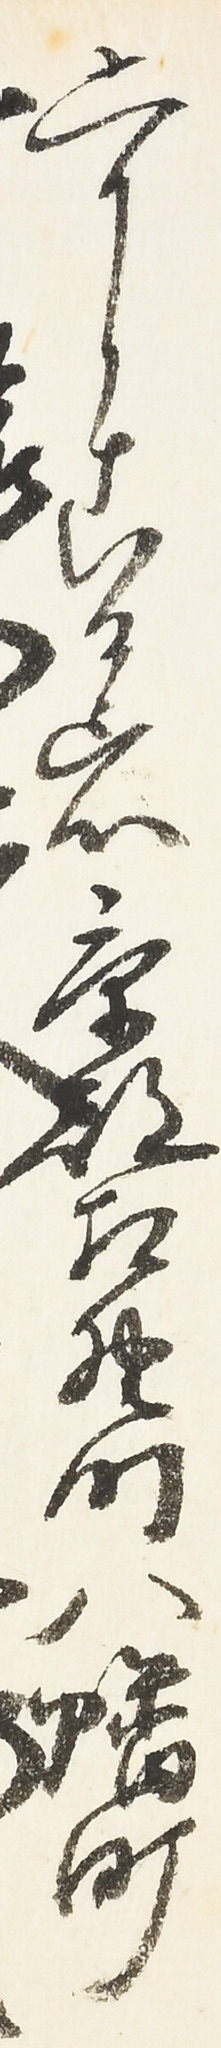六月十八日着京都相野町八幡町
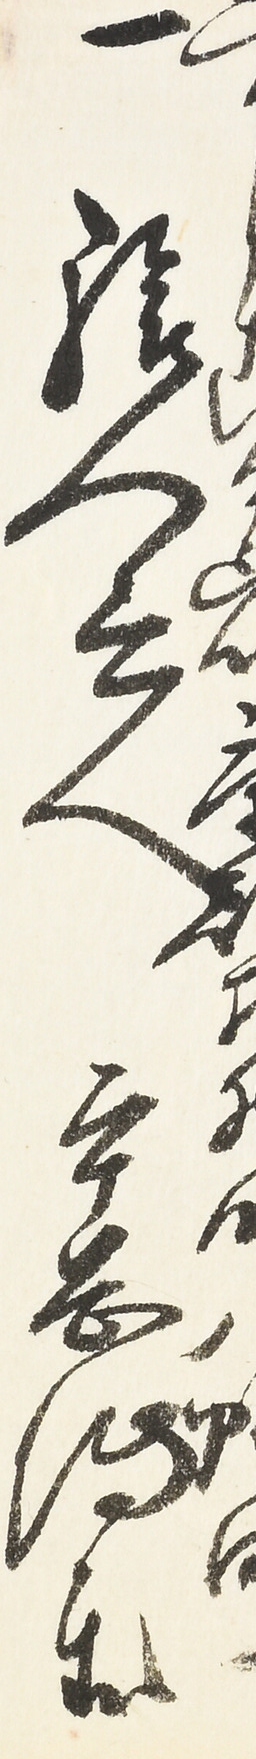一旅人壱人平岡伝兵衛
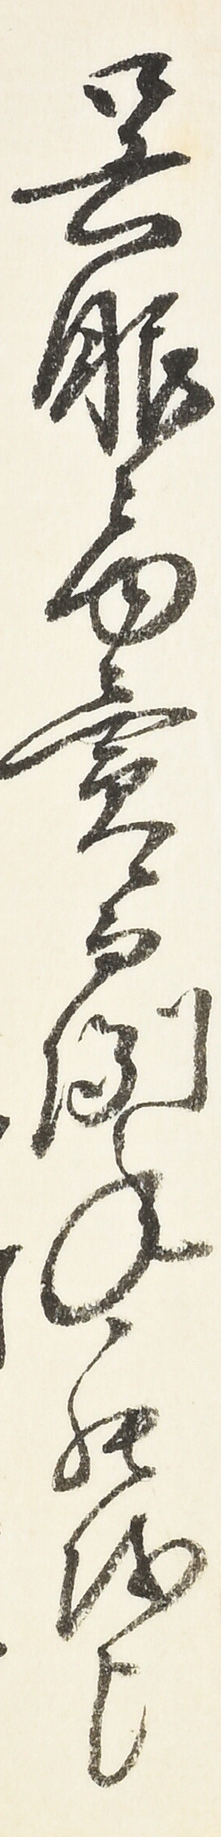呉服商売ニ而例年罷越申候
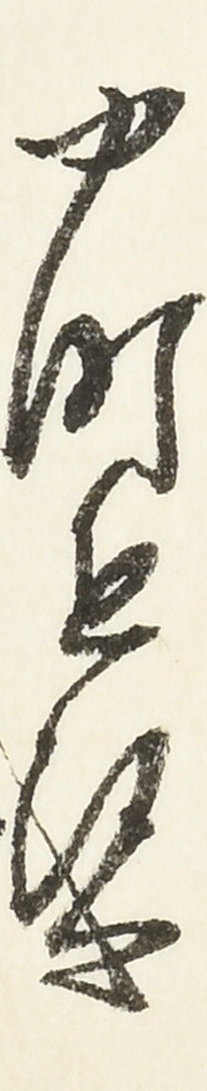中町近江や
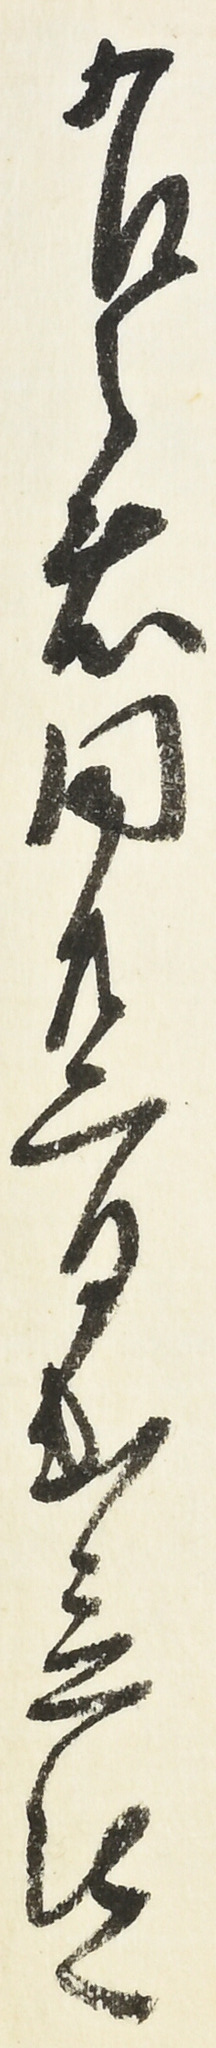右之者同廿二日出立仕候

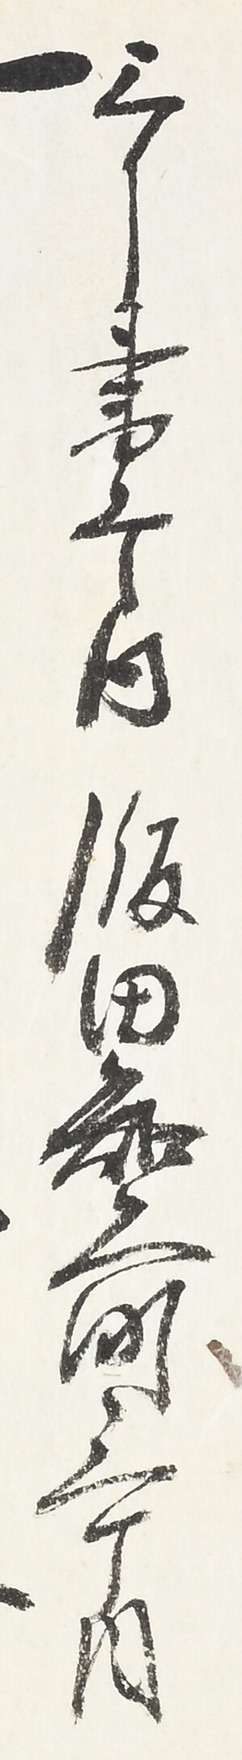三月書上之内飯田知久町三丁目
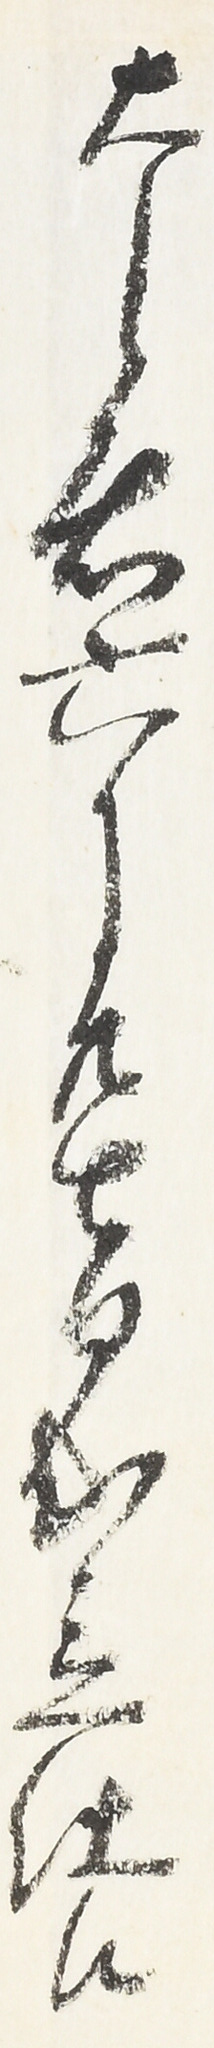右之者六月廿七日出立仕候
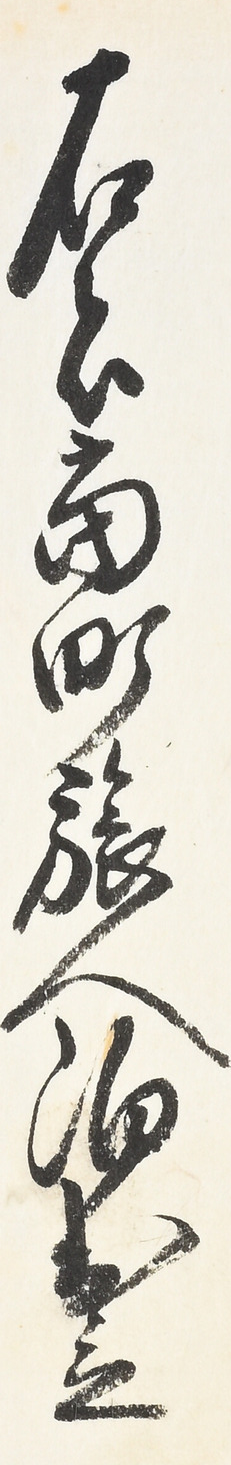右者当町旅人泊出立
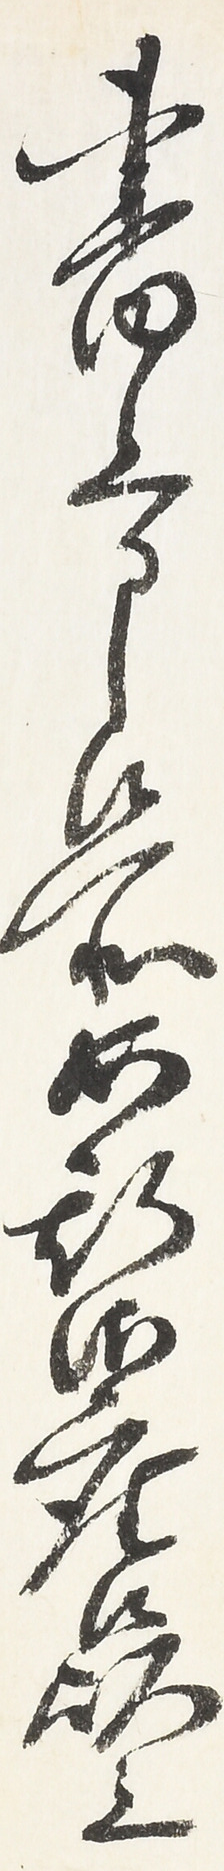書上申候所如斯御座候以上
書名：町中旅人泊控帳
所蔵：伊那市立高遠町図書館・合同会社AMANE
